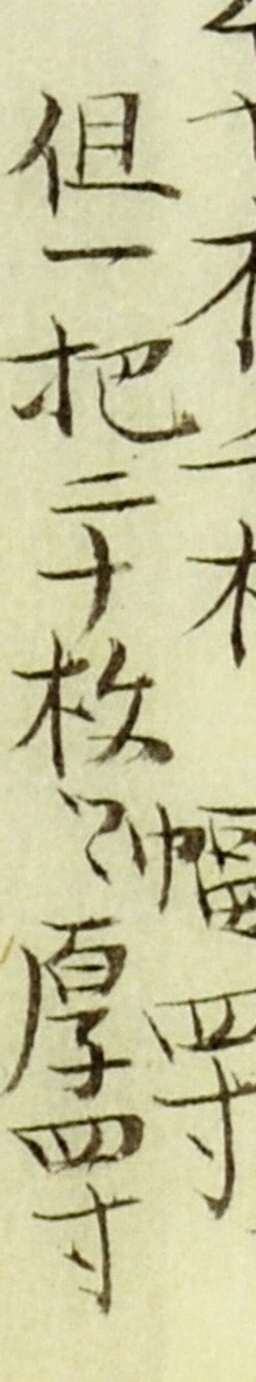但一把二十枚ツヽ厚四寸
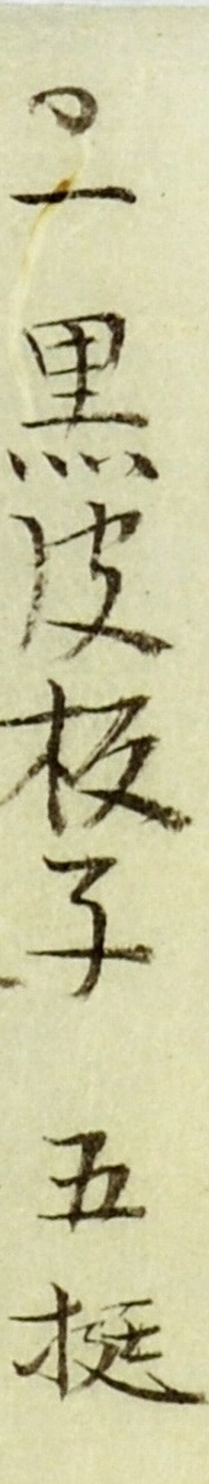〇一黒皮板子五挺
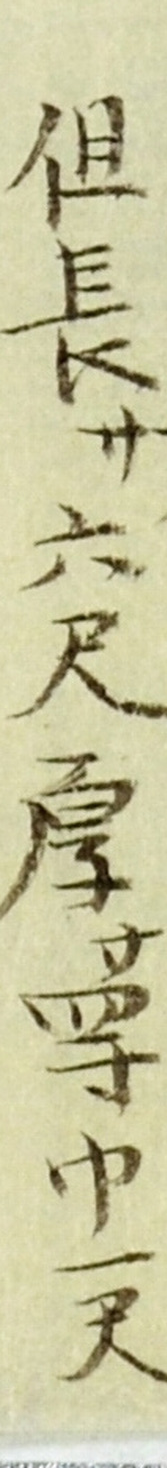但長サ六尺厚サ四寸巾一尺
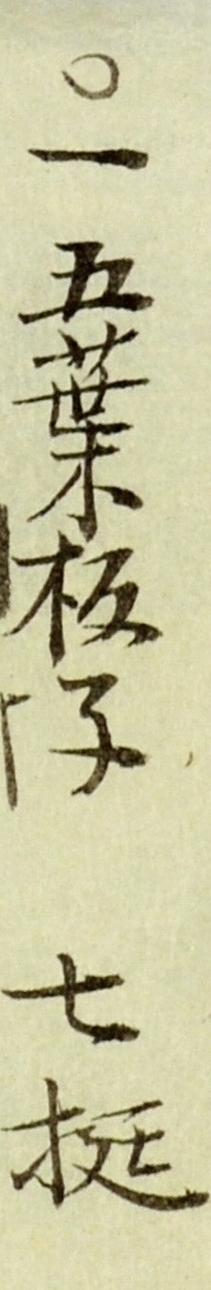〇一五葉板子七挺
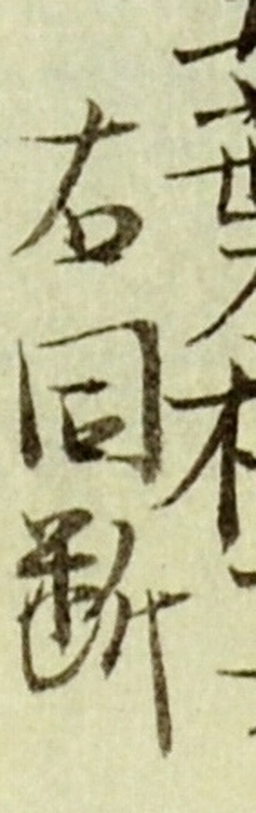右同断
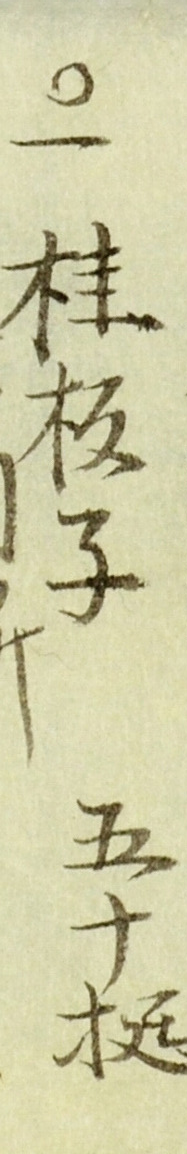〇一桂板子五十挺
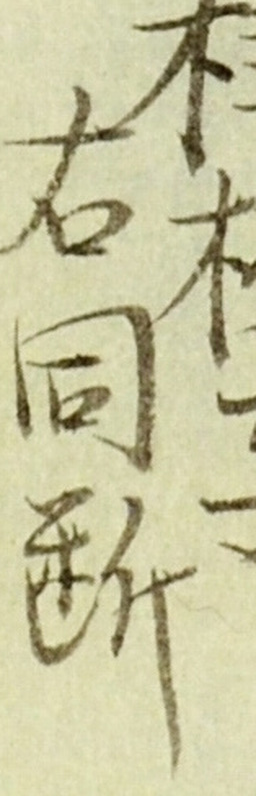右同断
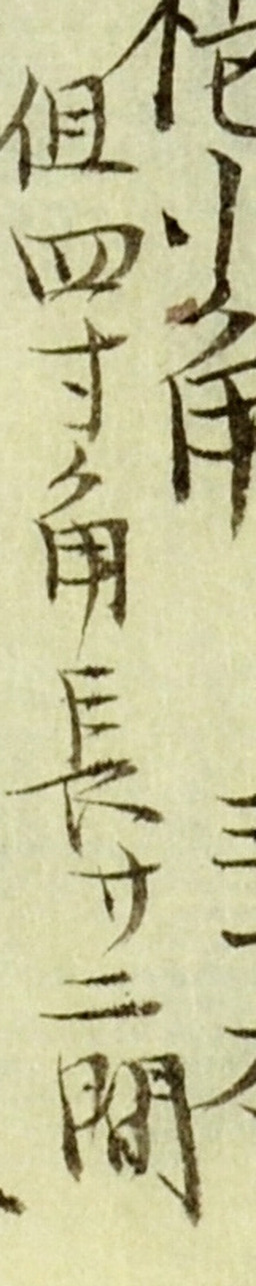但四寸角長サ二間
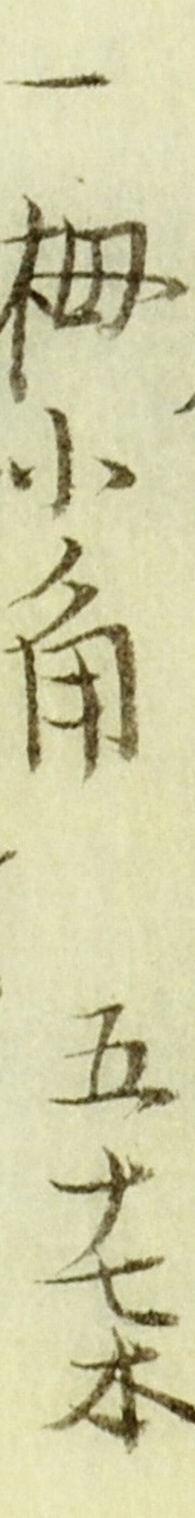一栂小角五十七本
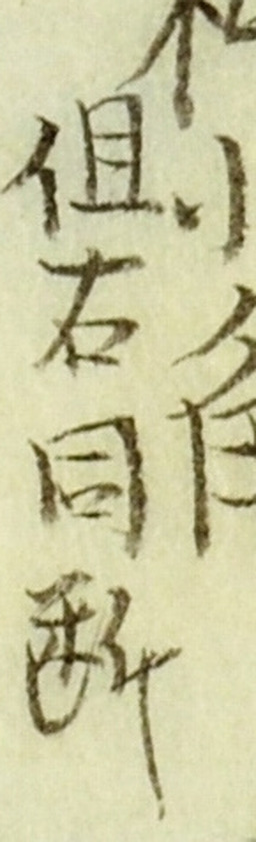但右同断
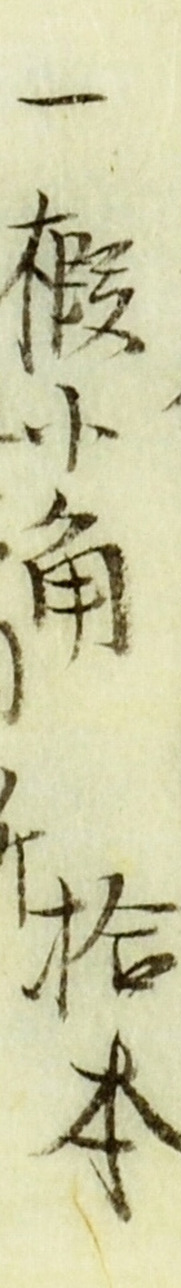一椵小角拾本
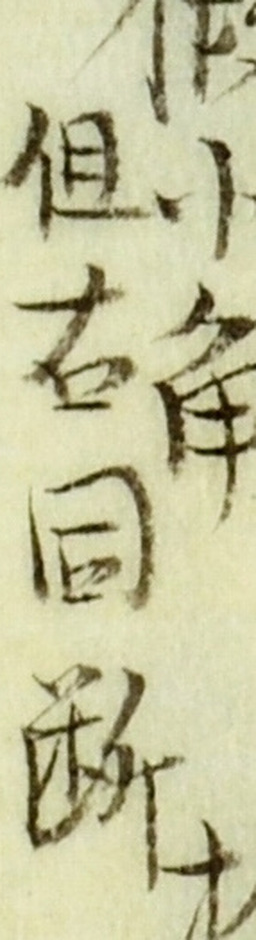但右同断
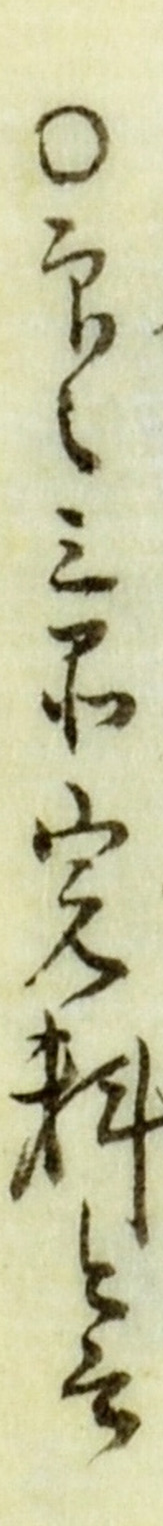〇印之三品完料とそ
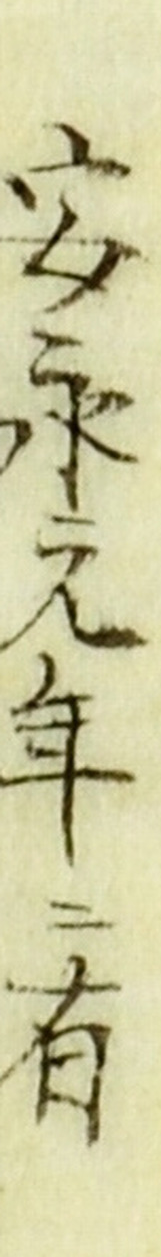安永元年ニ有
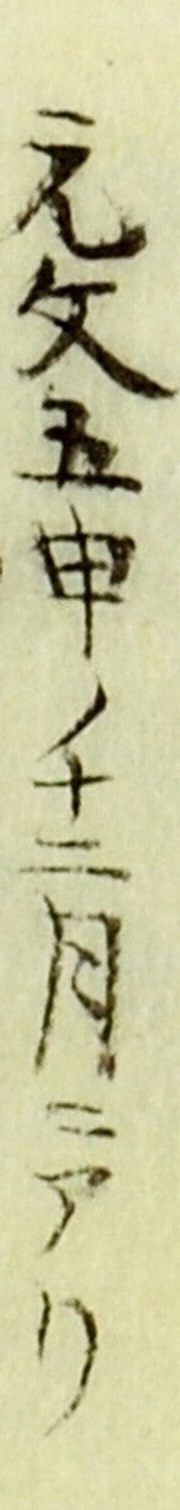元文五申ノ十二月ニアリ
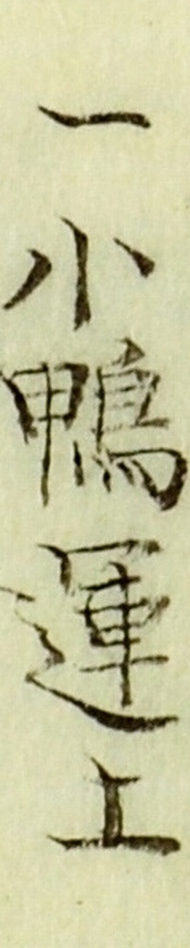一小鴨運上
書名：分一御定法
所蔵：伊那市立高遠町図書館・合同会社AMANE
